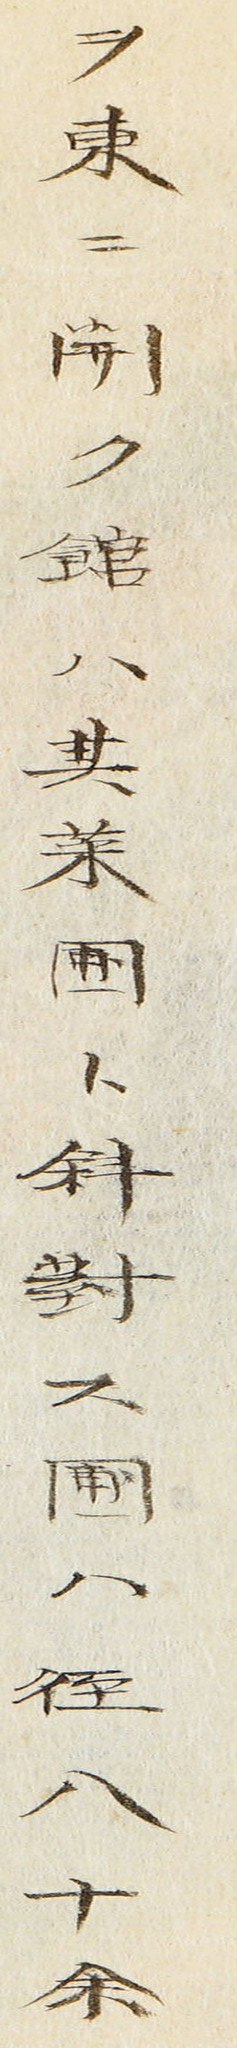ヲ東ニ開ク館ハ其菜圃ト斜對ス圃ハ径八十余
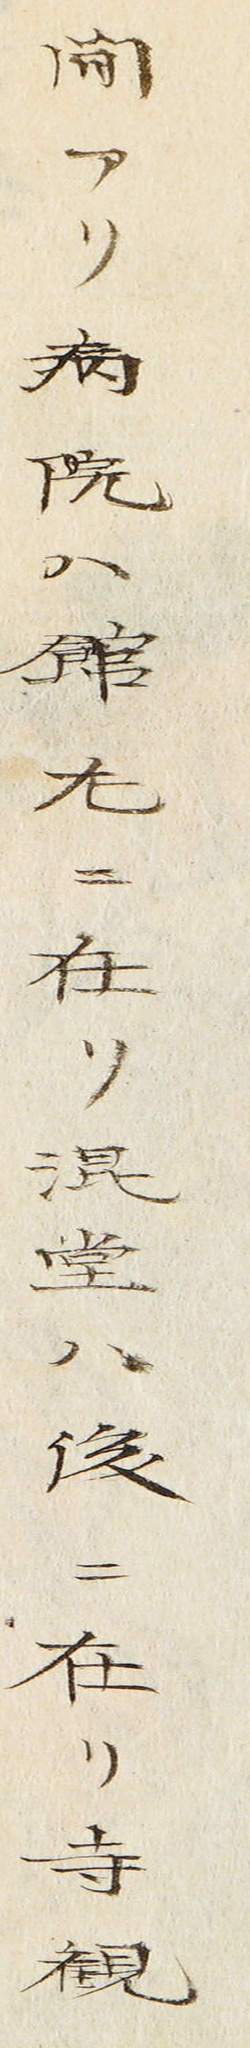間アリ病院ハ館左ニ在リ混堂ハ後ニ在リ寺観
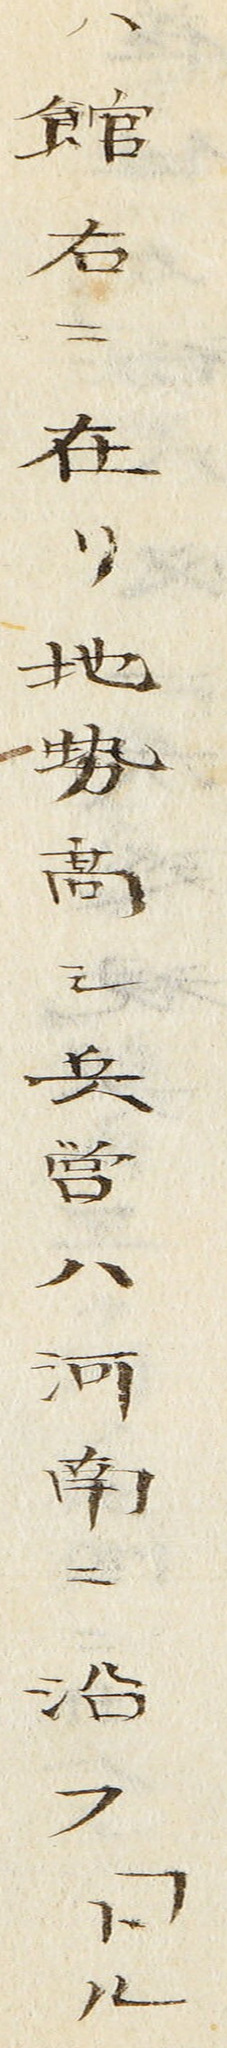ハ館右ニ在リ地勢高シ兵営ハ河南ニ沿フ「トル
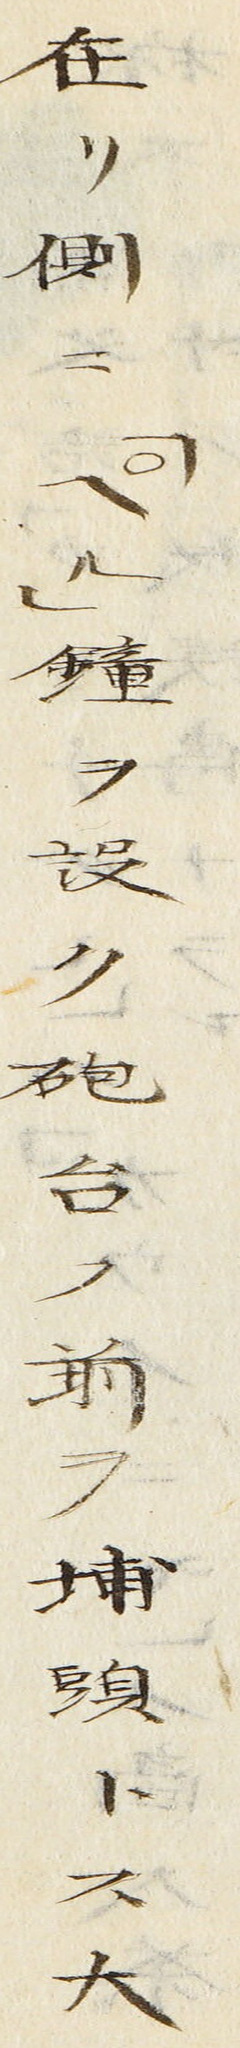在リ側ニ「ペル」鐘ヲ設ク砲台ノ前ヲ埔頭トス大
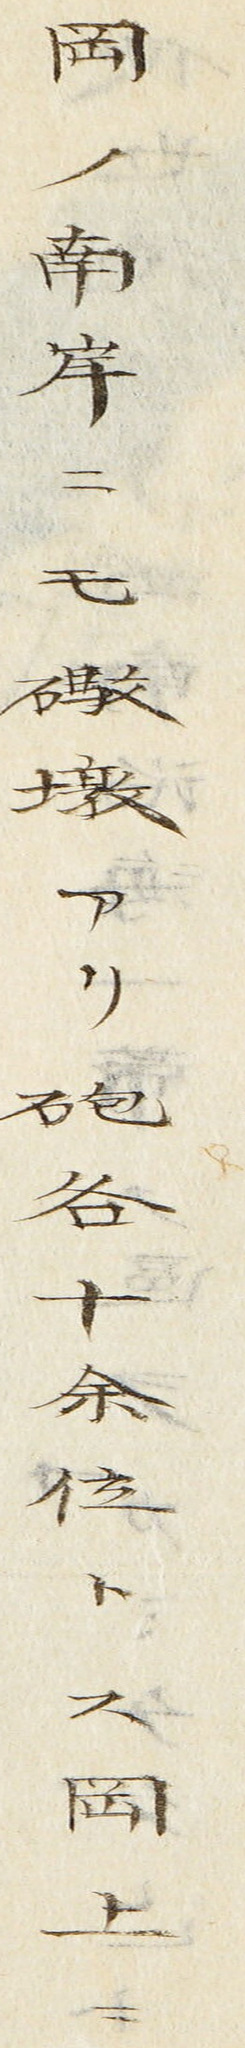岡ノ南岸ニモ礟墩アリ砲各十余位トス岡上ニ
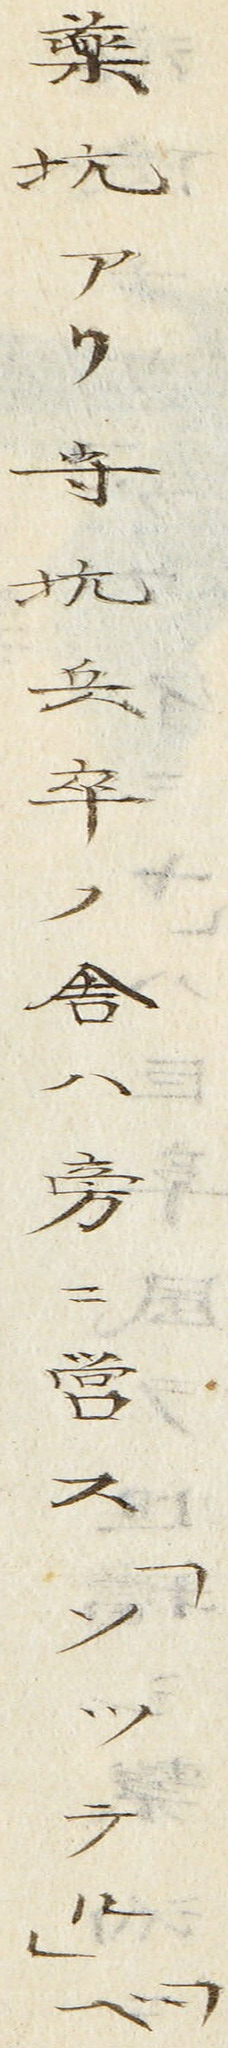薬坑アリ守坑兵卒ノ舎ハ旁ニ営ス「ソツテル」「ベ
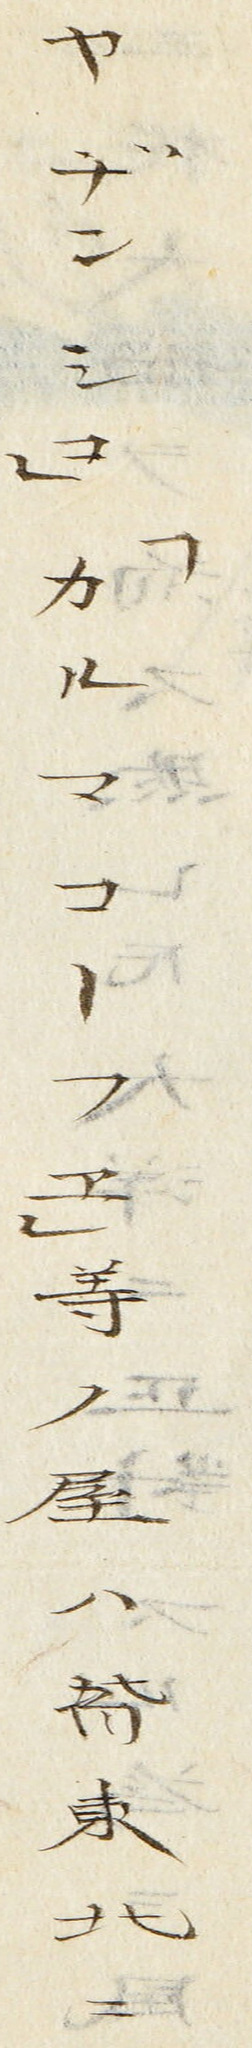ヤヂンシコ」「カルマコーフヱ」等ノ屋ハ皆東北ニ
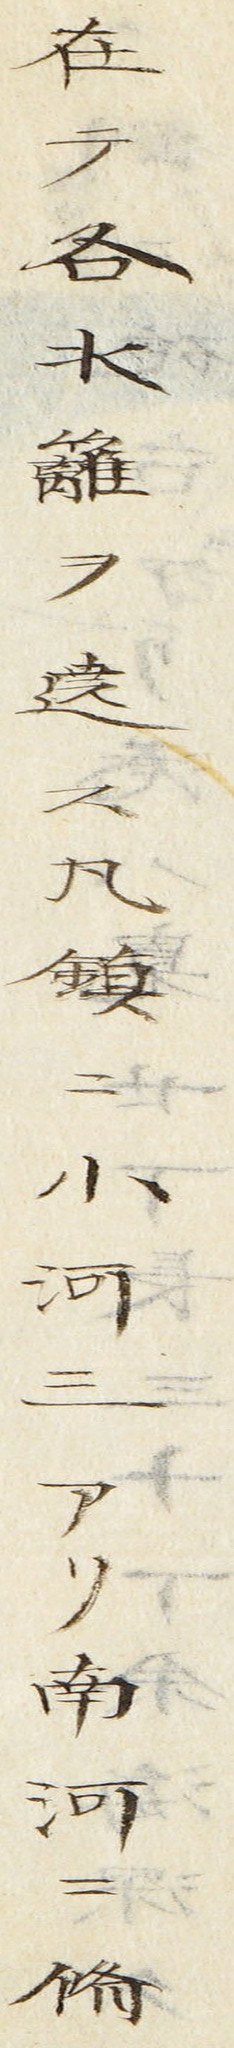在テ各水籬ヲ遶ス凡鎮ニ小河三アリ南河ニ脩
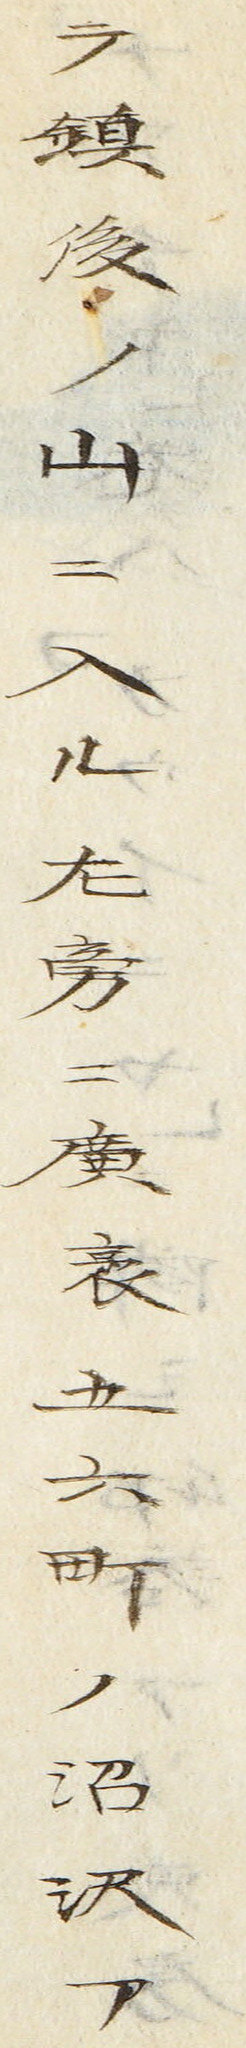テ鎮後ノ山ニ入ル左旁ニ廣五六町ノ沼沢ア
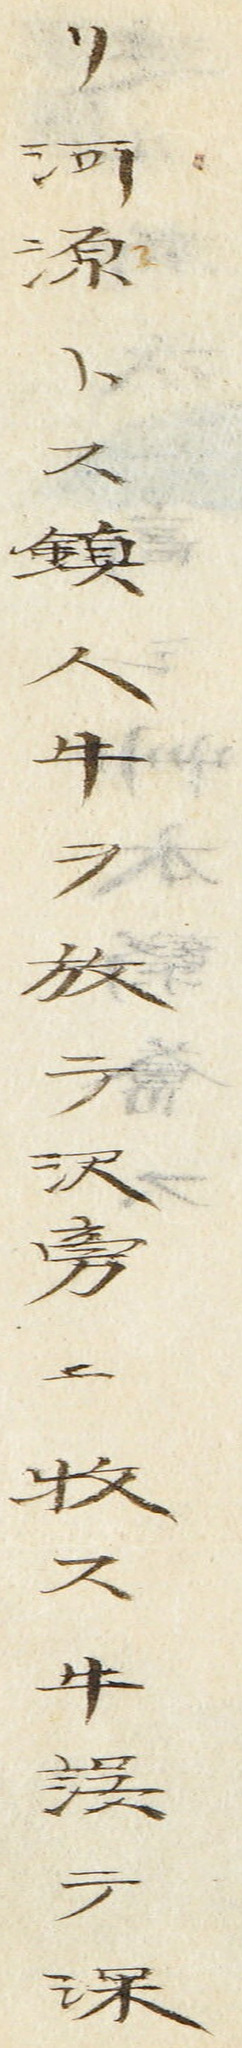リ河源トス鎮人牛ヲ放テ沢旁ニ牧ス牛誤テ深
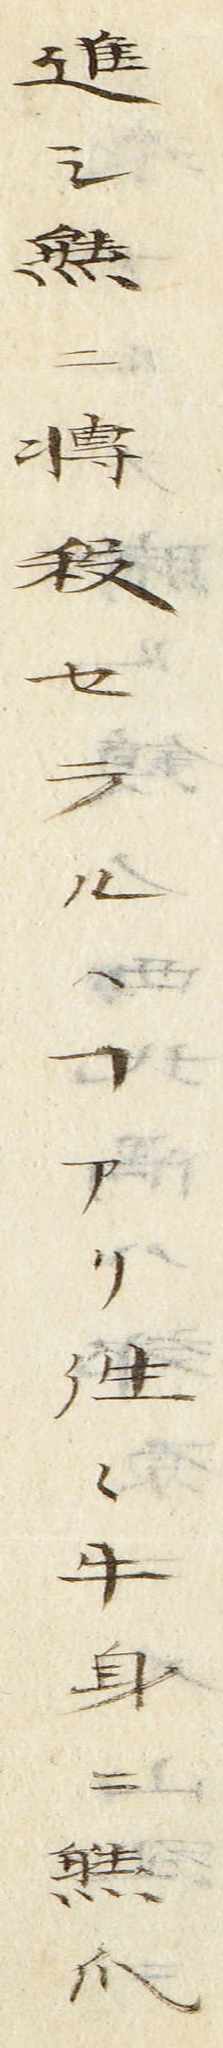進シ熊ニ摶？殺セラルゝコトアリ往々牛身ニ熊爪

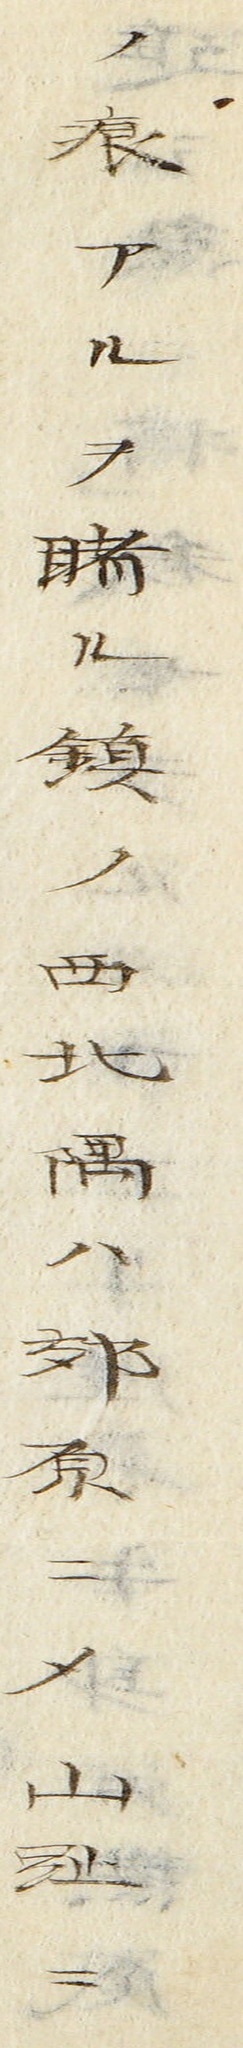ノ痕アルヲ睹ル鎮ノ西北ハ郊原ニシテ山趾ニ
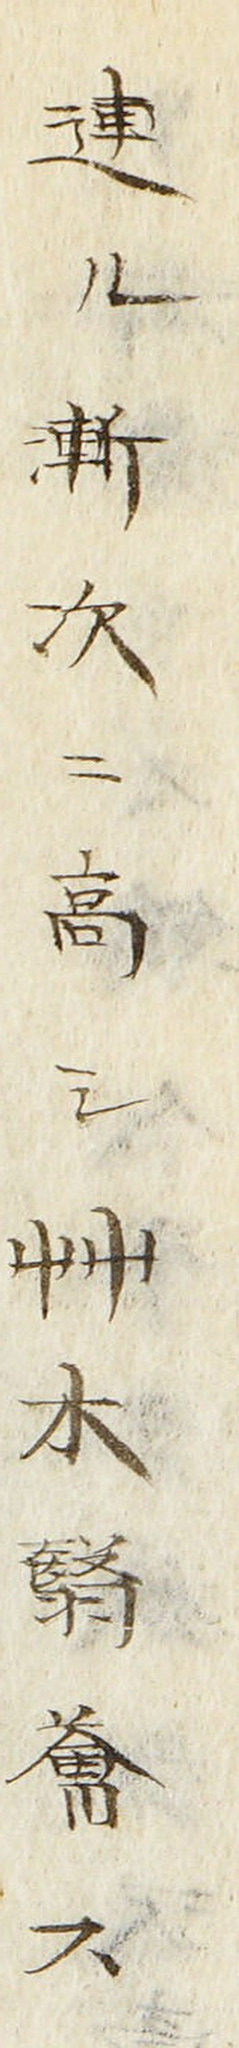連ル漸次ニ高シ艸木翳薈ス
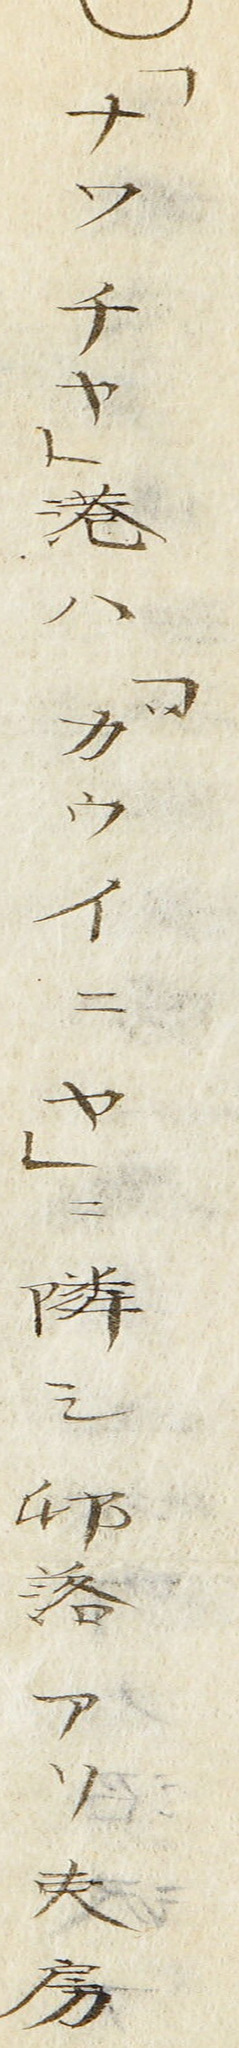〇「ナワチヤ」港ハ「ガウイニヤ」ニ隣シ邨落アリ吏房
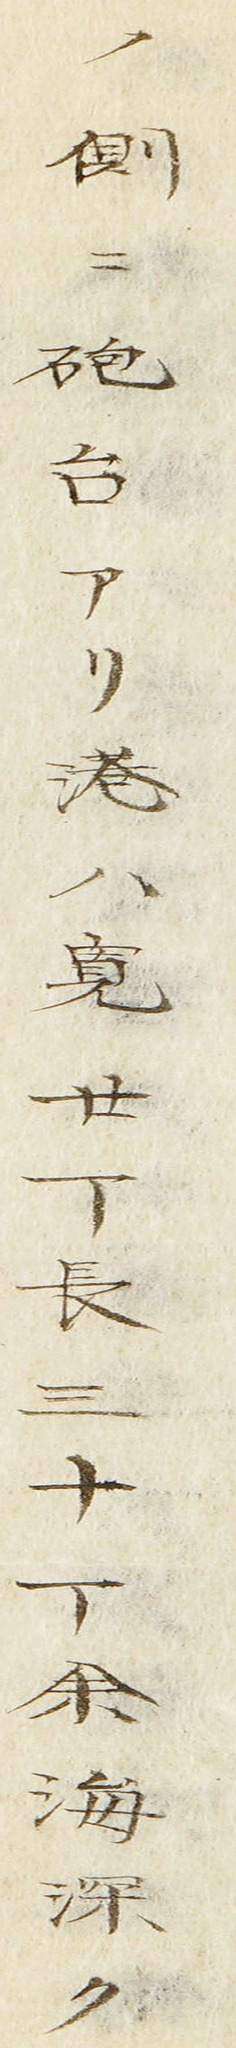ノ側ニ砲台アリ港ハ寛廿丁長三十丁余海深ク
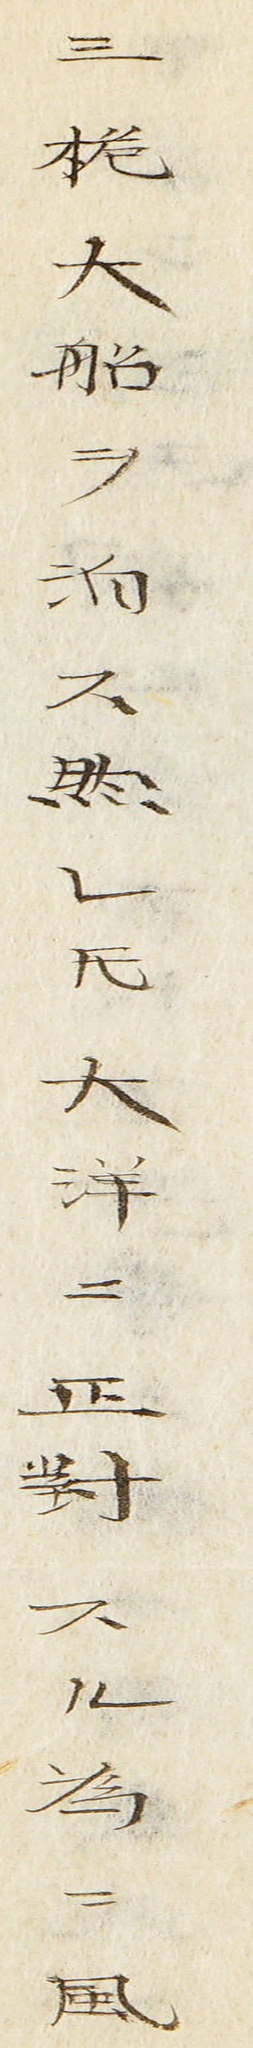三桅大船ヲ泊ス然レトモ大洋に正對スル為ニ風
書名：蕃談
